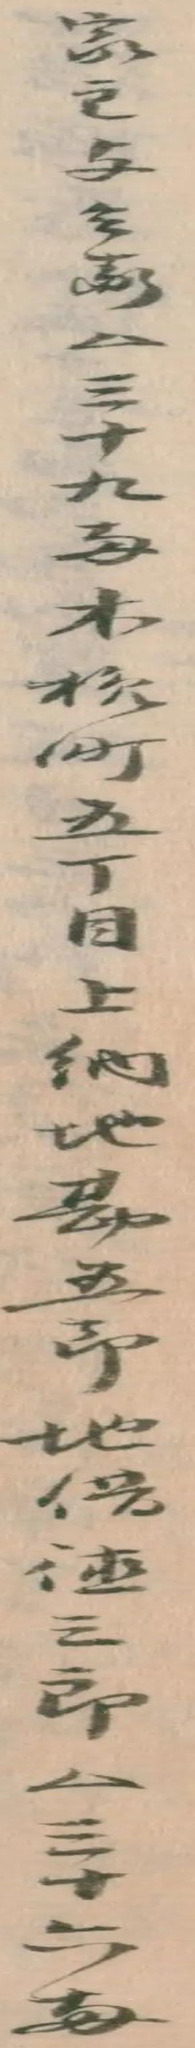家主与兵衛△三十九両木挽町五丁目上納地勘五郎地借徳三郎△三十六両
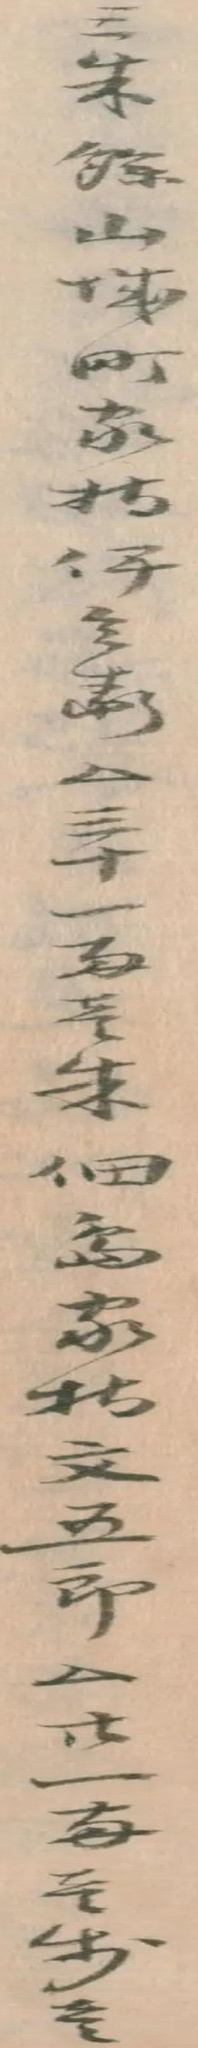三朱余山城町家持伊兵衛△三十一両壱朱佃島家持文五郎△廿一両壱歩壱
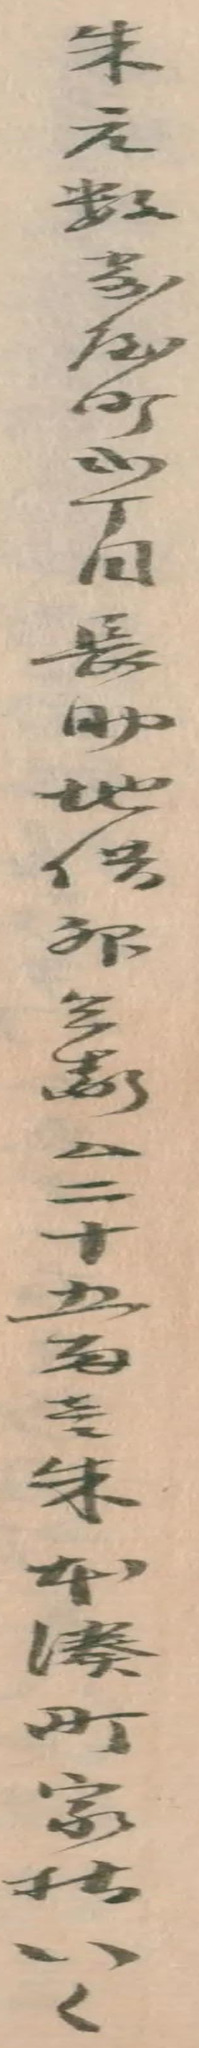朱元数寄屋町弐丁目長助地借卯兵衛△二十五両壱朱本湊町家持いく
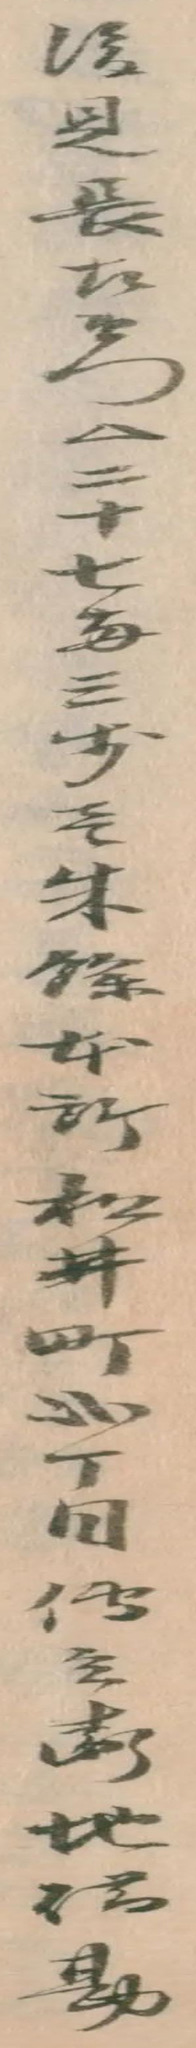後見長左衛門△二十七両三歩壱朱余本所松井町弐丁目伝兵衛地借勘
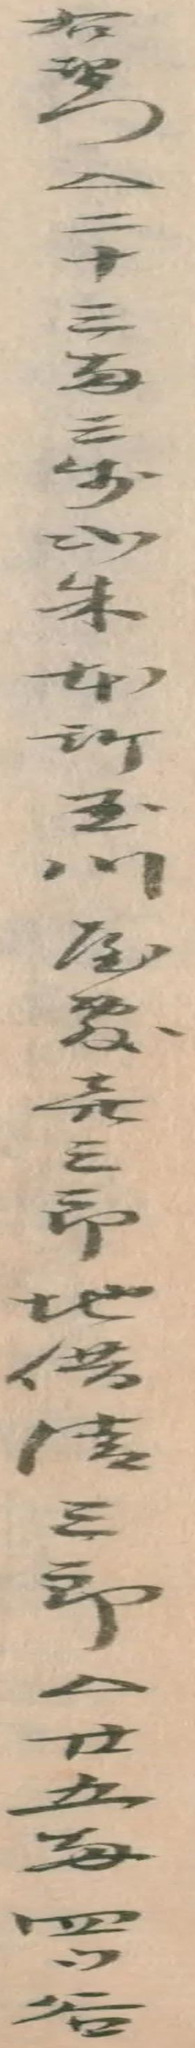右衛門△二十三両三歩弐朱本所玉川屋敷喜三郎地借清三郎△廿五両四ッ谷
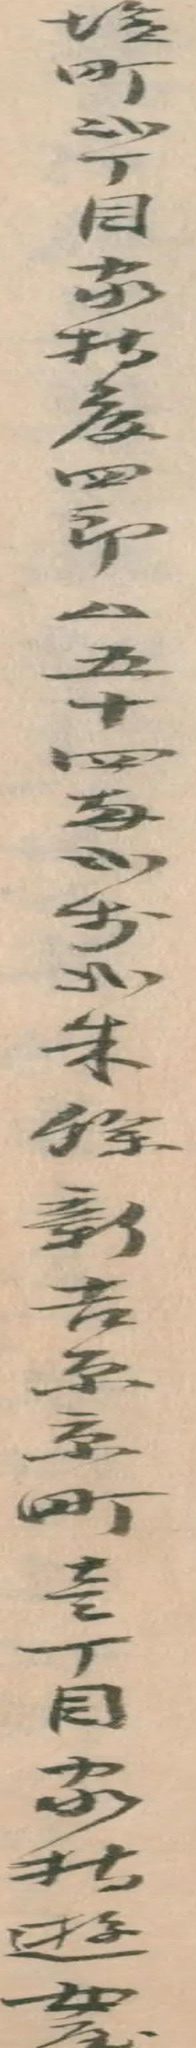塩町弐丁目家持藤四郎△五十四両弐歩弐朱余新吉原京町壱丁目家持遊女屋

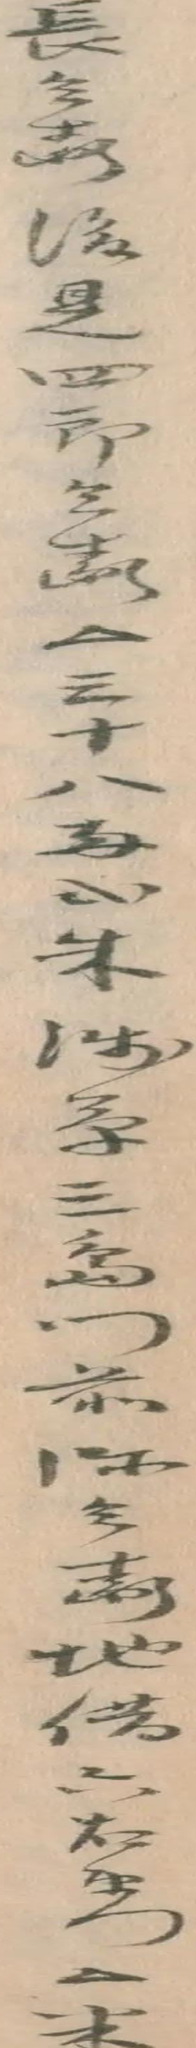長兵衛後見四郎兵衛△三十八両弐朱浅草三島門前弥兵衛地借六右衛門△米
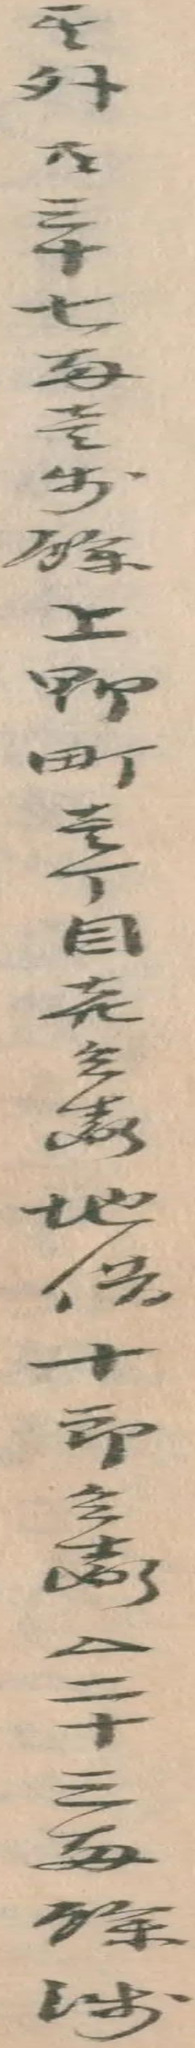其外共三十七両壹歩余上野町壹丁目喜兵衛地借十郎兵衛△二十三両余浅
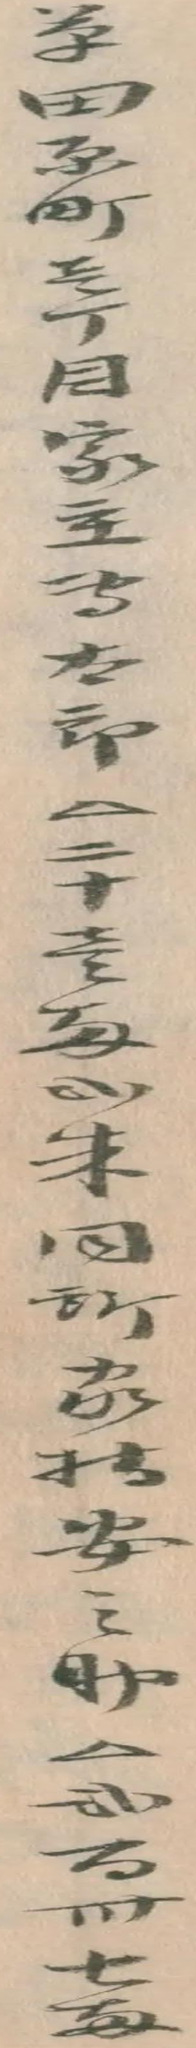草田原町壱丁目家主専太郎△二十壱両弐朱同所家持安之助△弐百卅七両
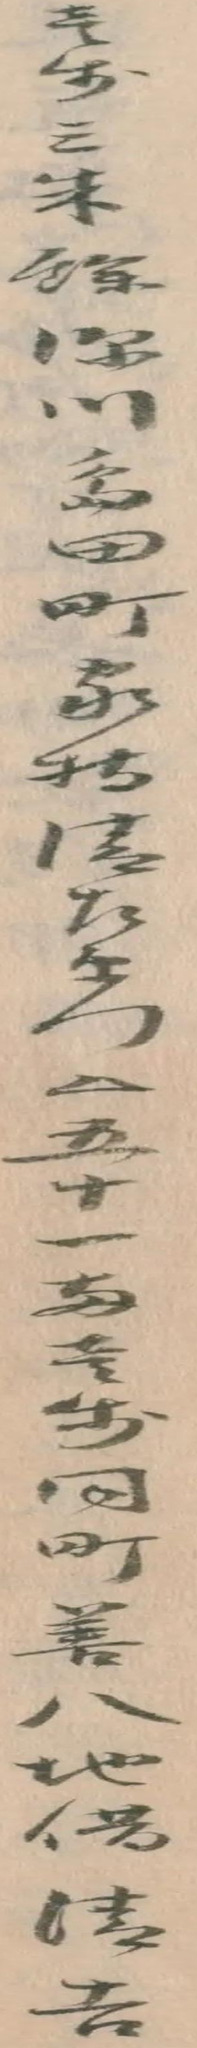壱歩三朱余深川島田町家持清左衛門△五十一両壹歩同町善八地借清吉
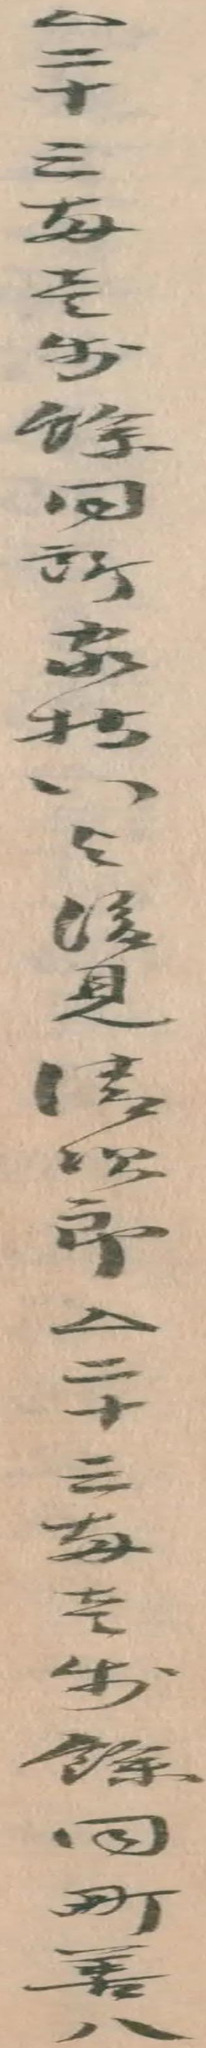△二十三両壱歩余同所家持いよ後見清次郎△二十三両壱歩同町善八
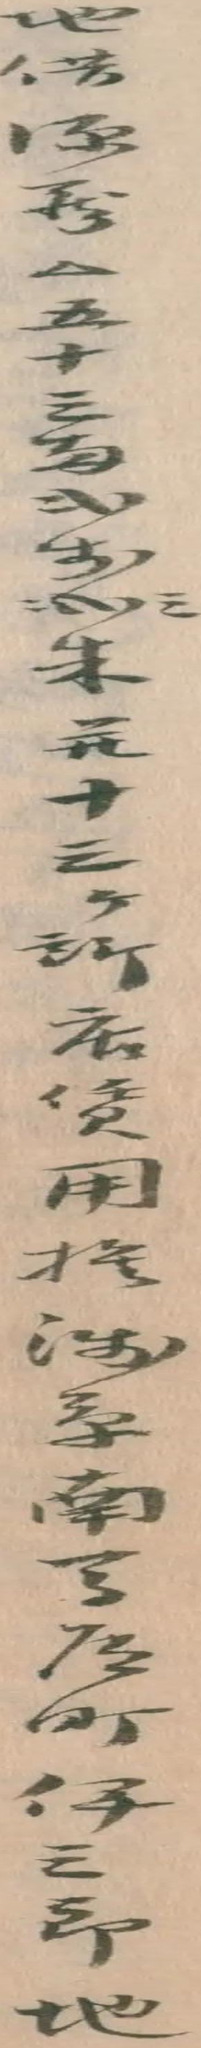地借源蔵△五十三両弐歩弐朱并十三ケ所店賃用捨浅草南馬道町伊三郎地
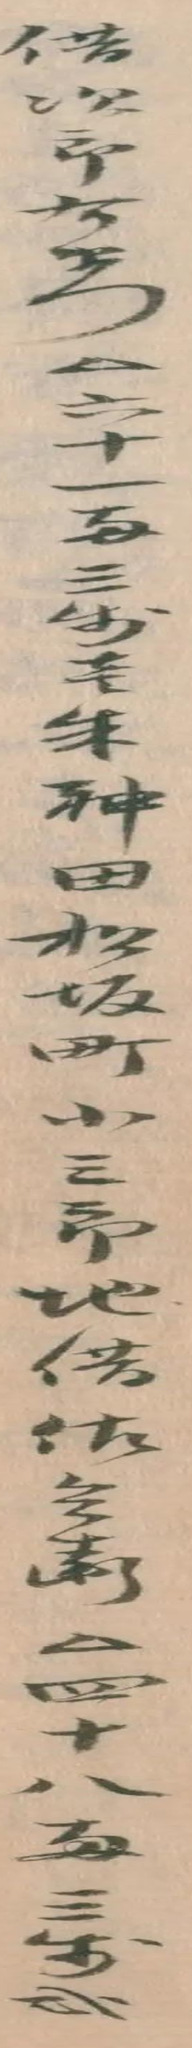借次郎右衛門△六十一両三歩壹朱神田松坂町小三郎地借佐兵衛△四十八両三歩弐
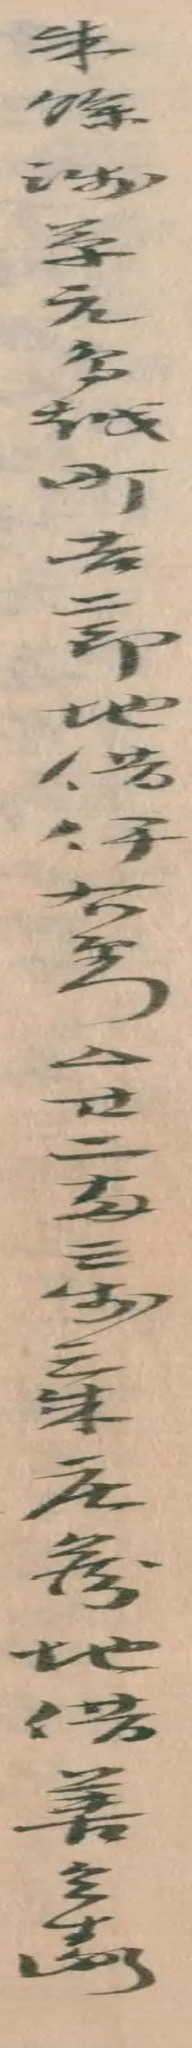朱余浅草元鳥越町吉二郎地借伊右衛門△廿二両三歩三朱庄蔵地借善兵衛
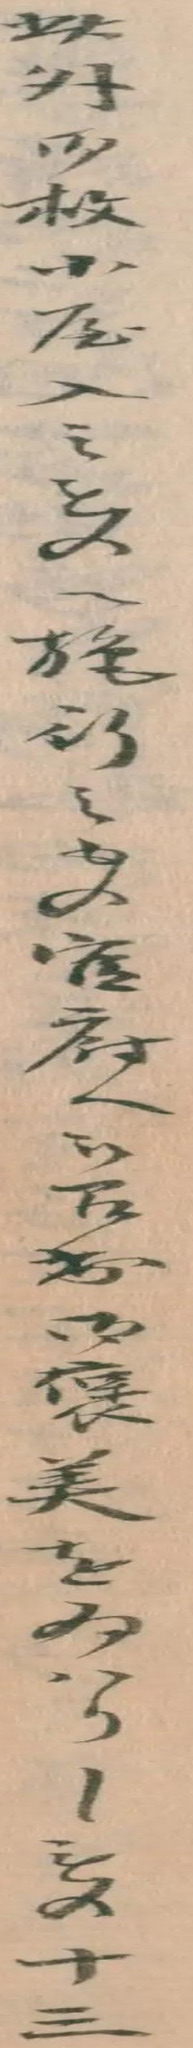此外御救小屋入之ものへ施行之もの官府へ御召出御褒美を給はりしもの十三
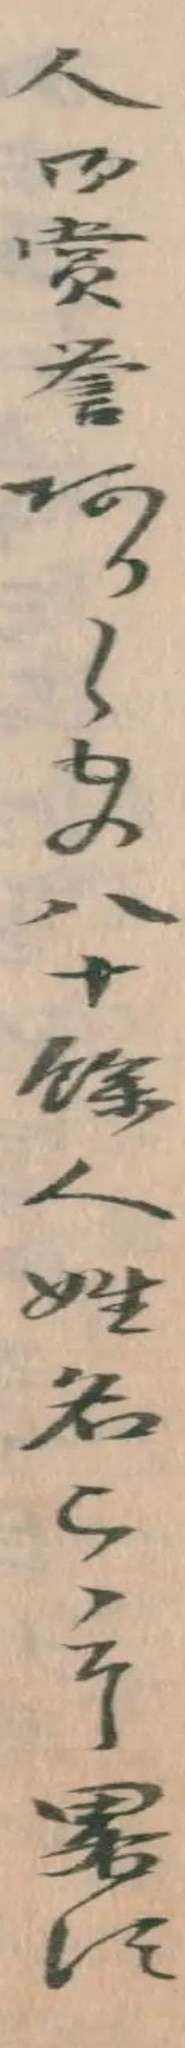人御賞誉ありしもの八十余人姓名こゝに略す
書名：地災撮要. 巻10(地震之部) 上,下
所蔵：国立国会図書館 National Diet Library, JAPAN
